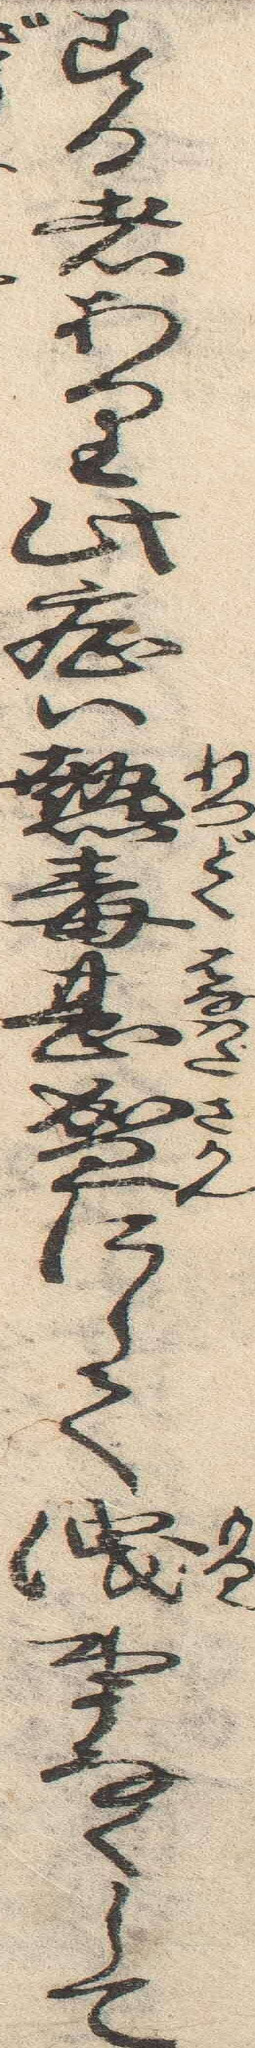する者あり此症は熱毒甚盛にして洩事なくして
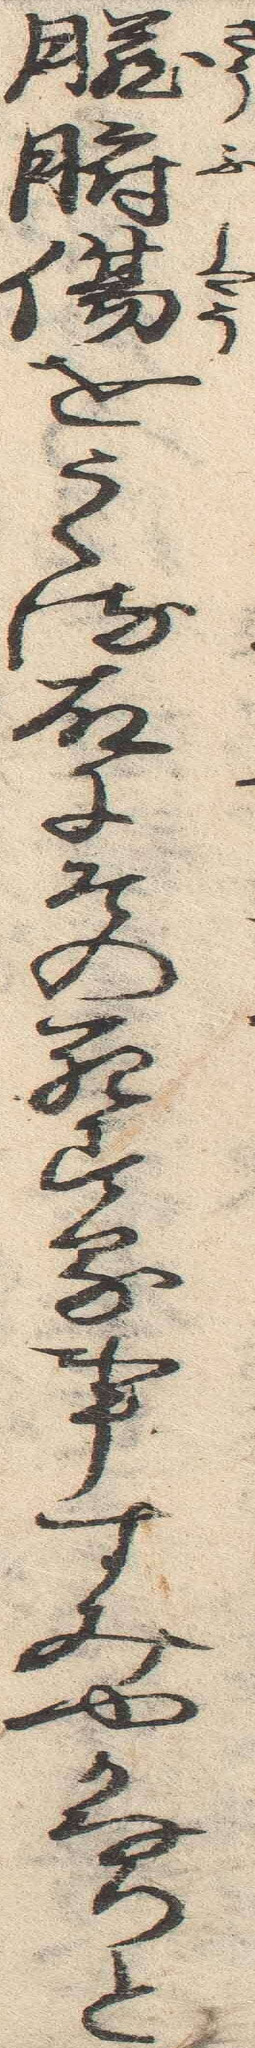臓腑傷をうくる故にその死する事すみやかなりと
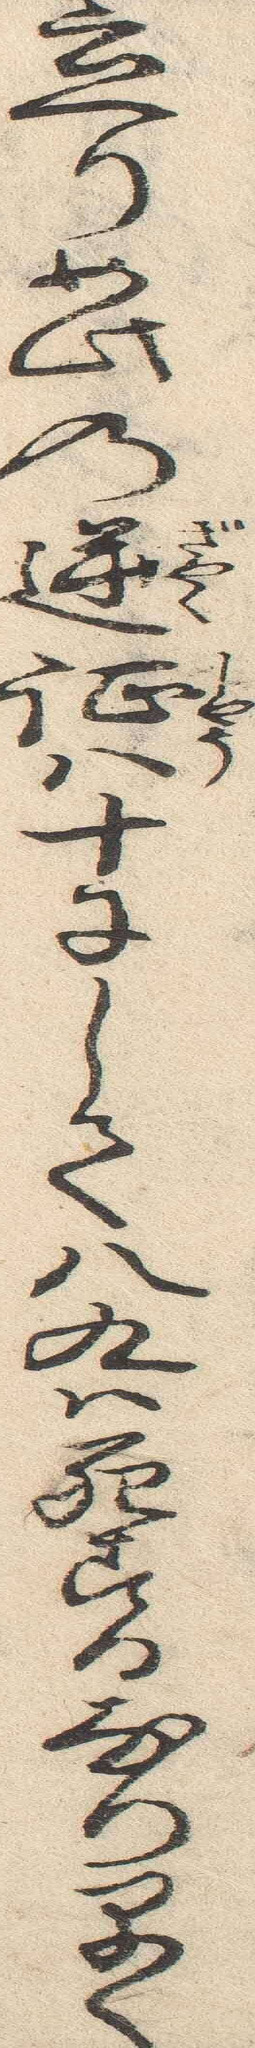云へり如此の逆証は十にして八九は死するなり早く
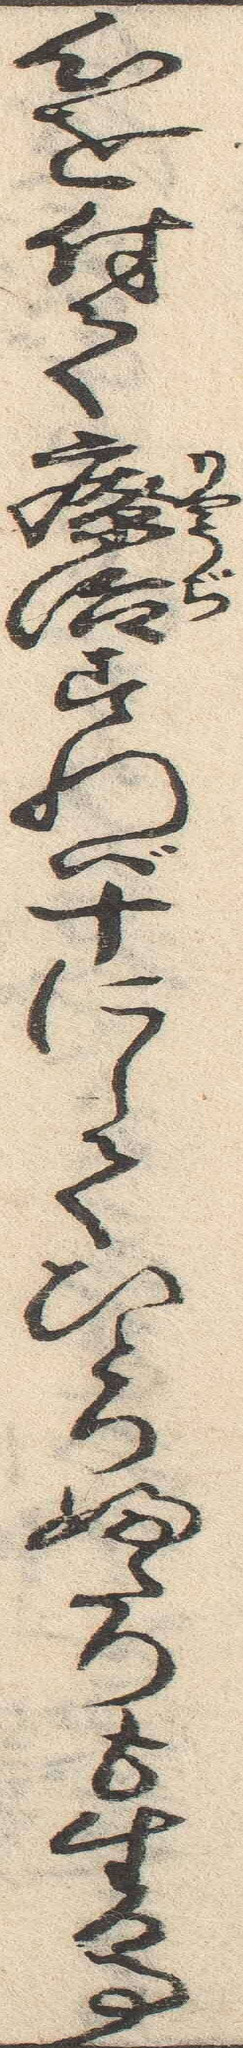心を付て療治すれば十にしてひとりふたりも生る事
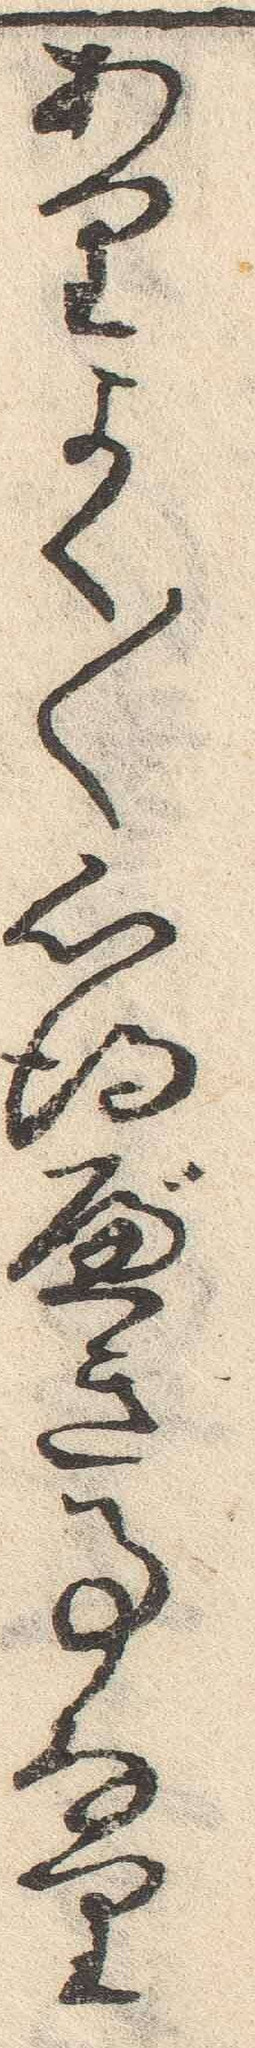ありよく〳〵心得べき事なり
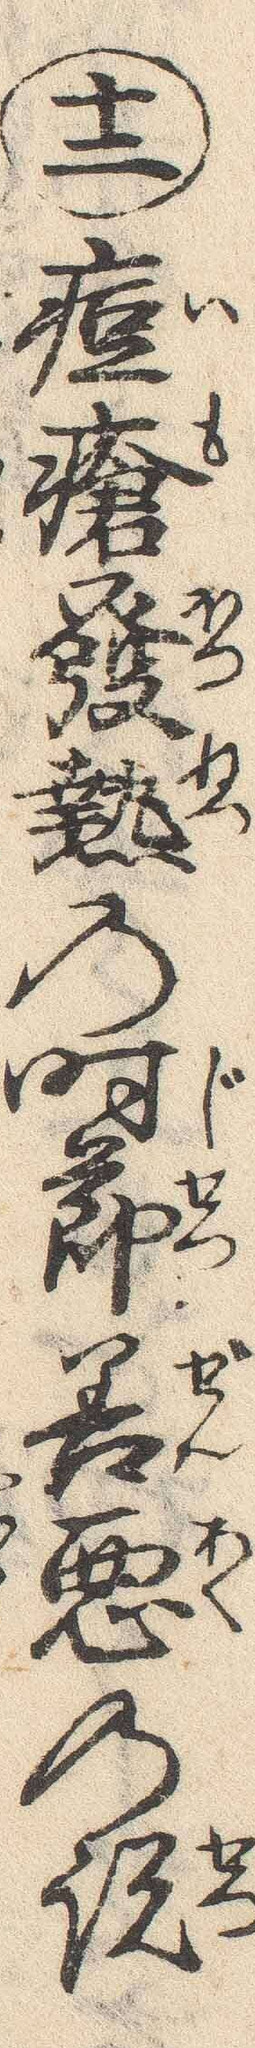(十二)痘瘡発熱の時節善悪の説
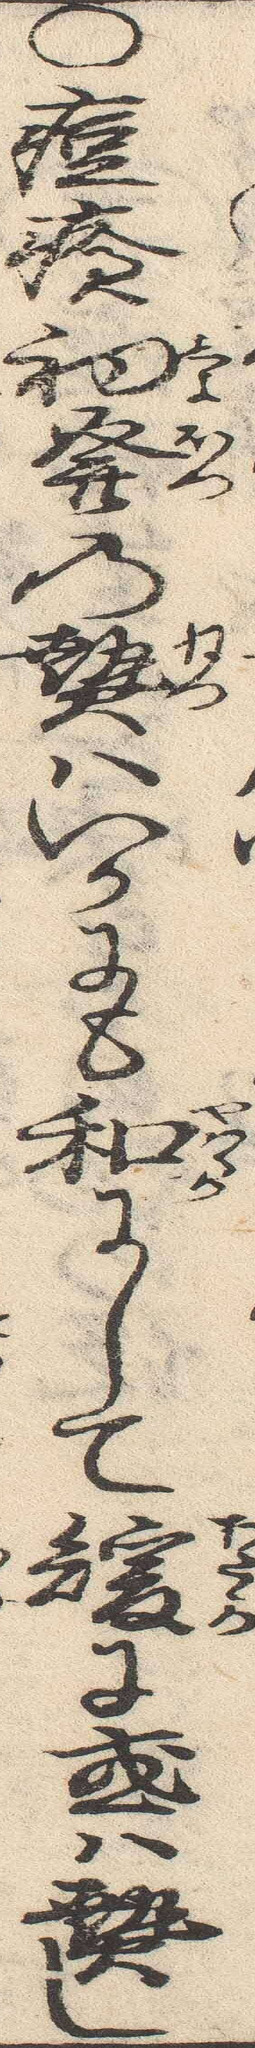○痘瘡初発の熱はいかにも和にして煖に或は熱し
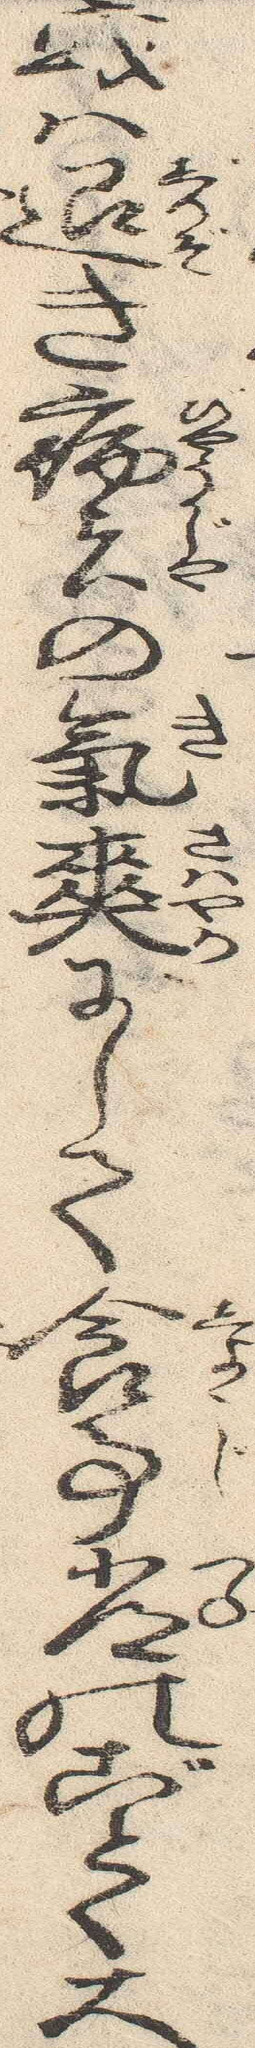或は退き病者の気爽にして食事常のごとく大
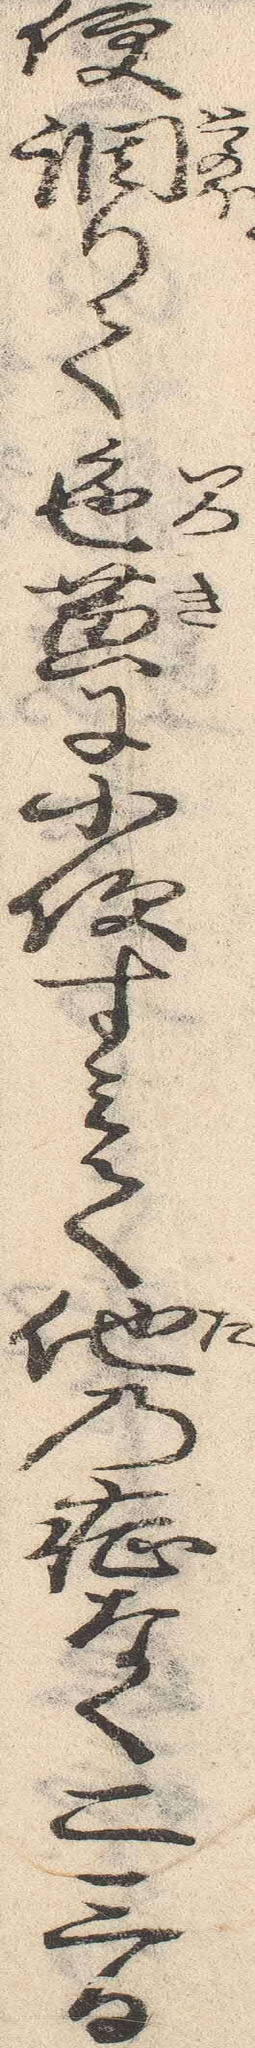便調りて色黄に小便すみて他の症なく二三日
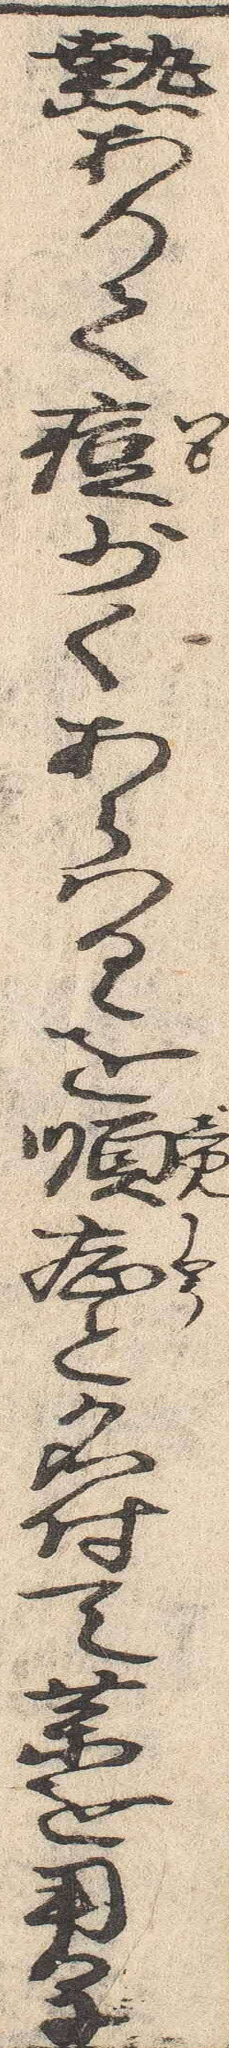熱ありて痘少くあらはるゝを順症と名付て薬を用るに
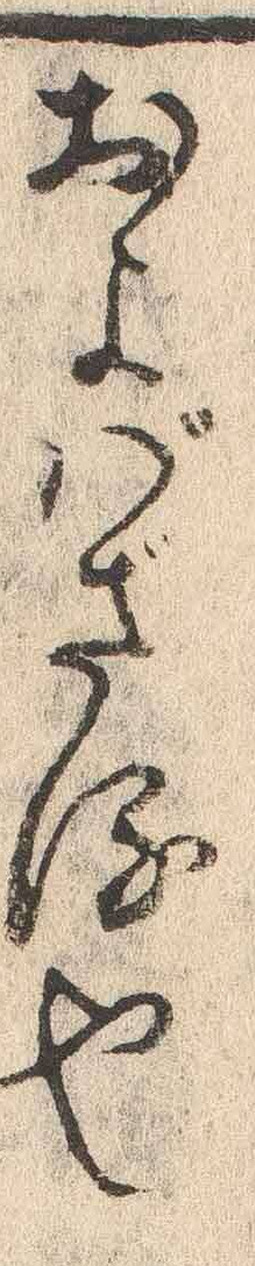およばざる也
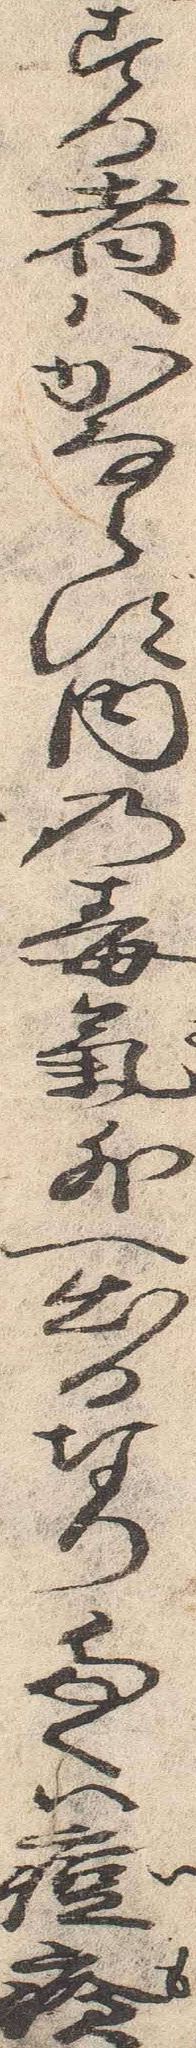する者はかならす内の毒気外へ出るなり多くは痘瘡
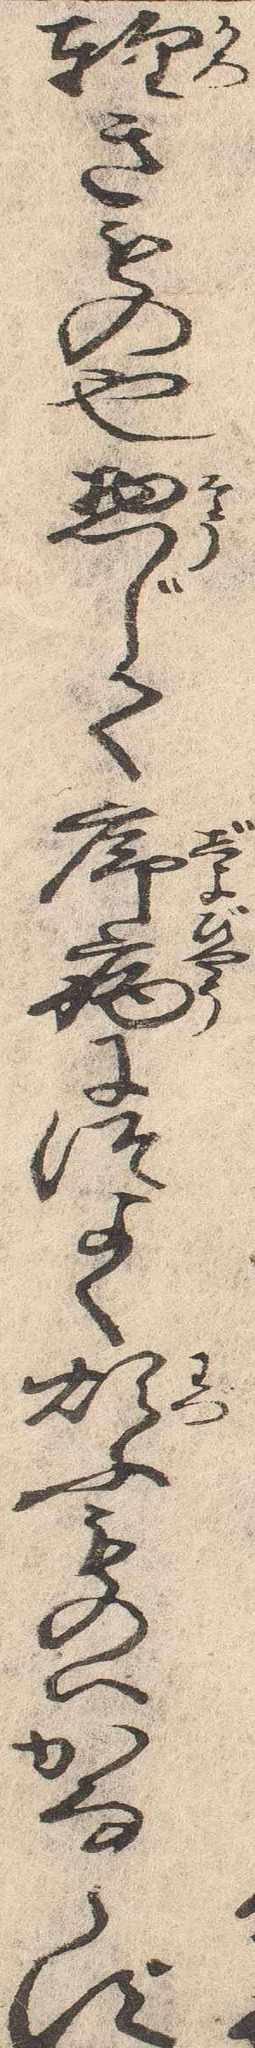軽きもの也総じて序病につよく煩ふものはかならず
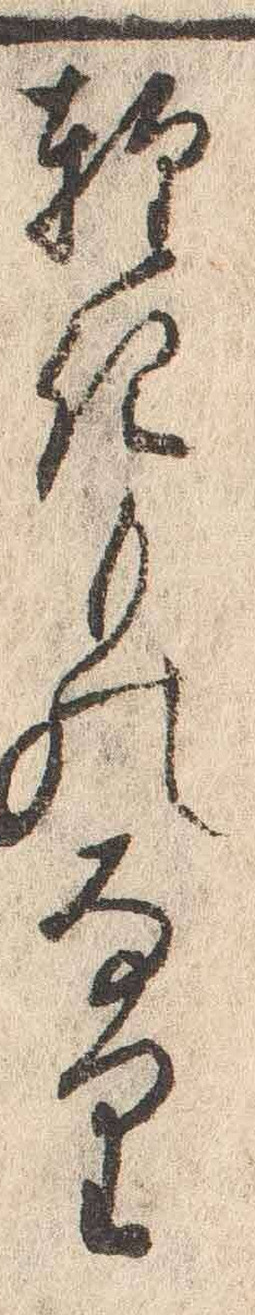軽きものなり
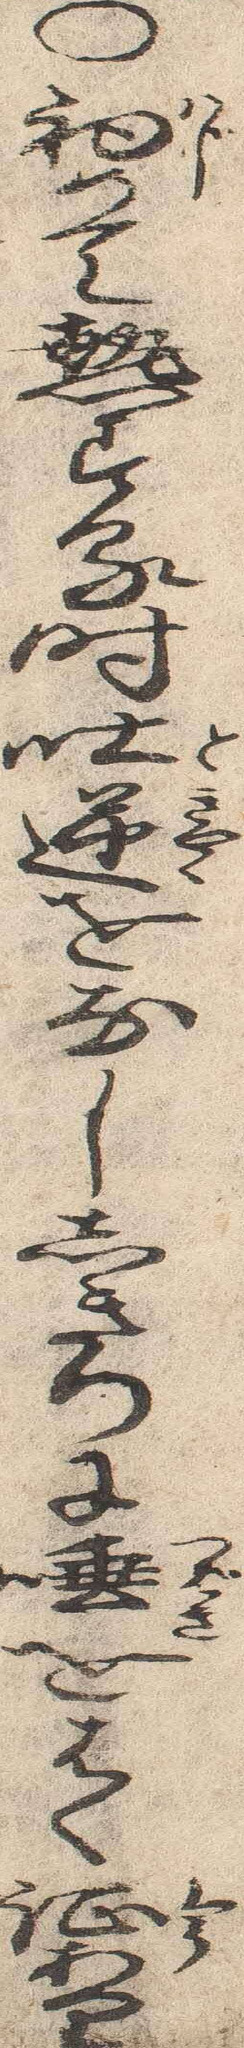○初めて熱する時吐逆をなししきりに唾をはく証あり
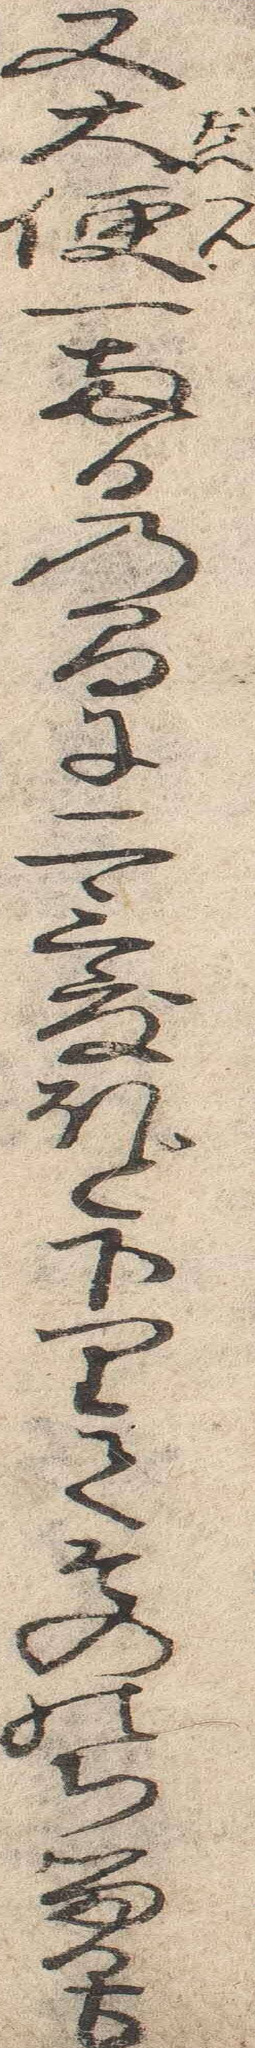又大便一両日の間に二三度ほど下りてそののち留るも
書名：小児必用養育草
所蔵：東京学芸大学附属図書館 国文学研究資料館
